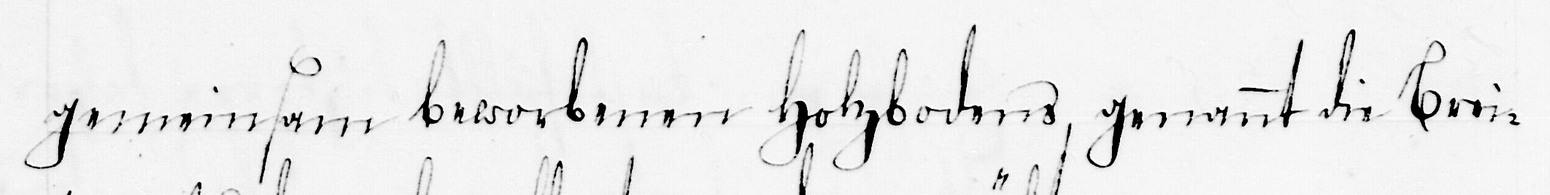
gemeinsam beworbenen Holzbodens, genannt die Brei¬
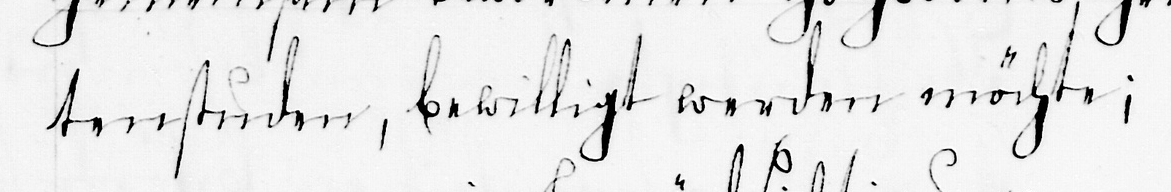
tenstuden, bewilligt werden möchte;
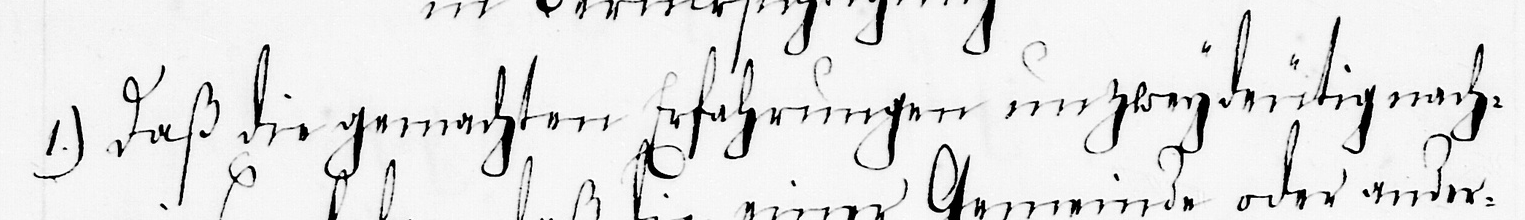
1.) Daß die gemachten Erfahrungen unzweydeutig nach¬
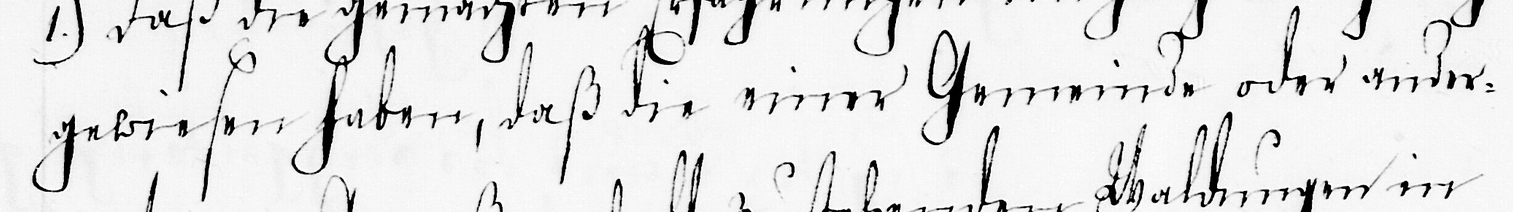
gewiesen haben, daß die einer Gemeinde oder ander¬
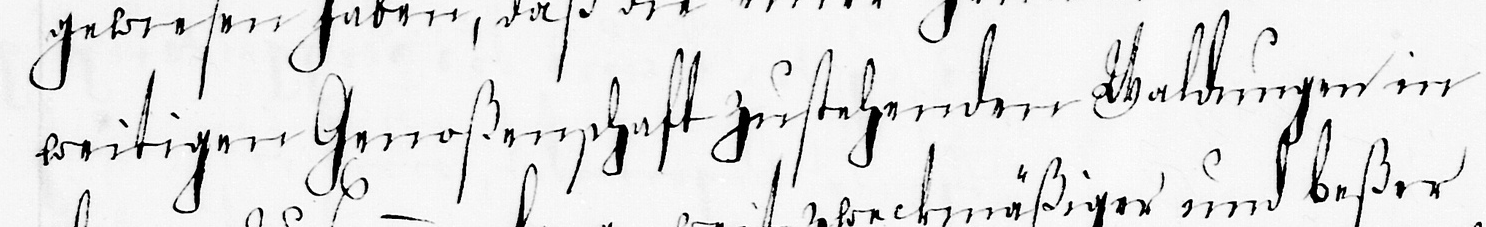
weitigen Genoßenschaft zustehenden Waldungen in
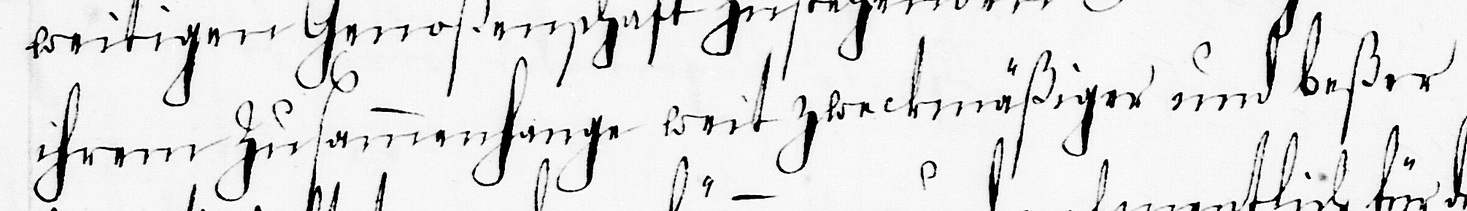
ihrem Zusammenhange weit zweckmäßiger und beßer
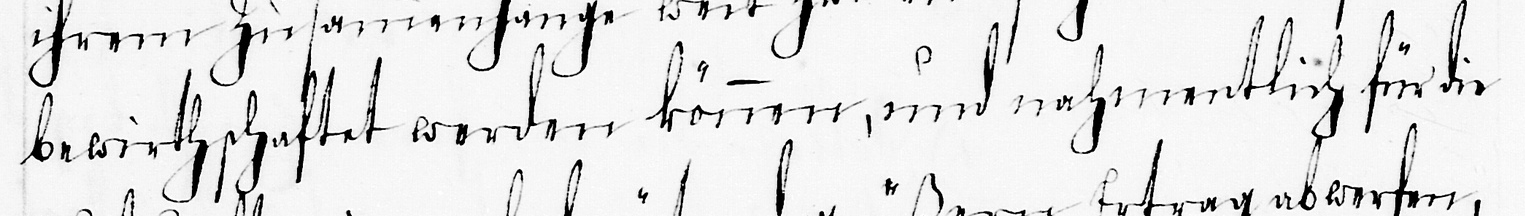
bewirthschaftet werden können, und nahmentlich für die
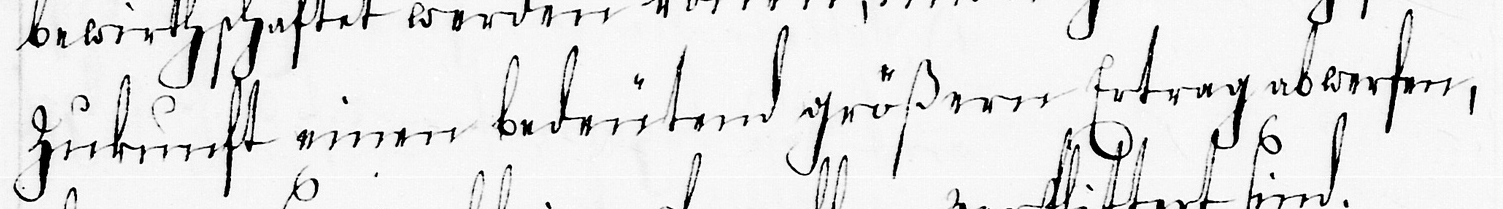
Zukunft einen bedeutend größern Ertrag abwerfen,
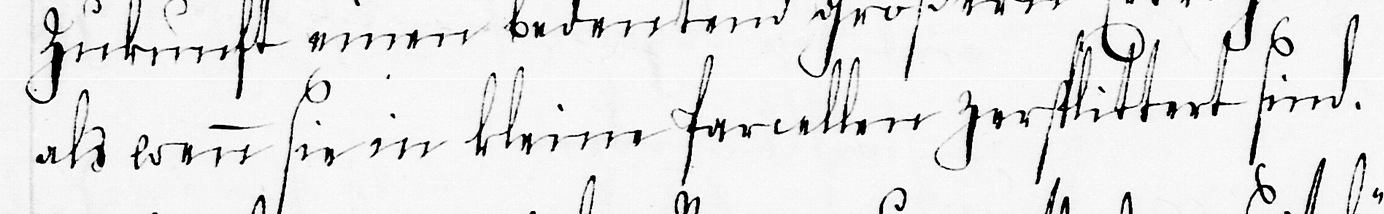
als wenn sie in kleine Parcellen zersplittert sind.
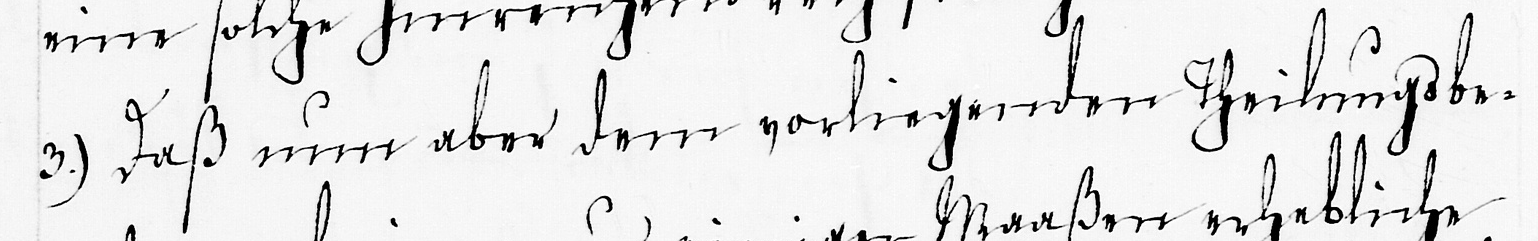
2.) Daß nun aber dem vorliegenden Theilungsbe¬
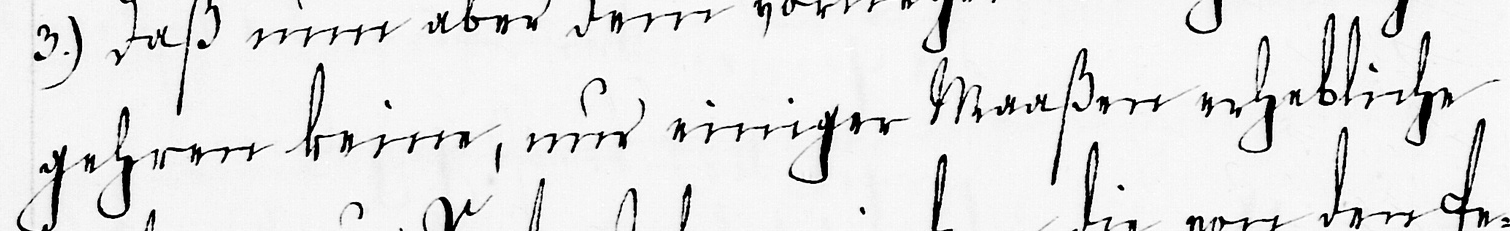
gehren keine, nur einiger Maaßen erhebliche
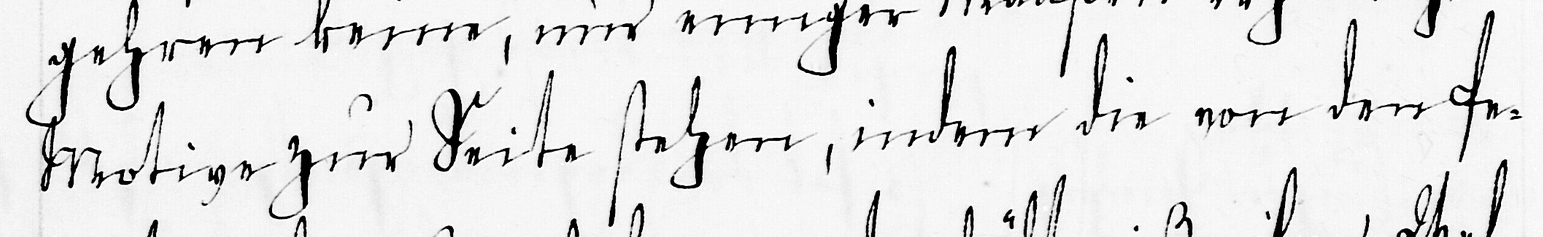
Motive zur Seite stehen, indem die von den Pe¬
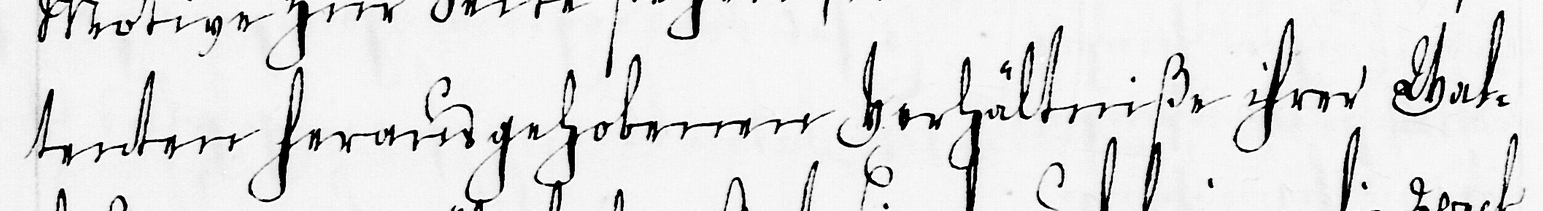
tenten herausgehobenen Verhältniße ihrer Wal¬
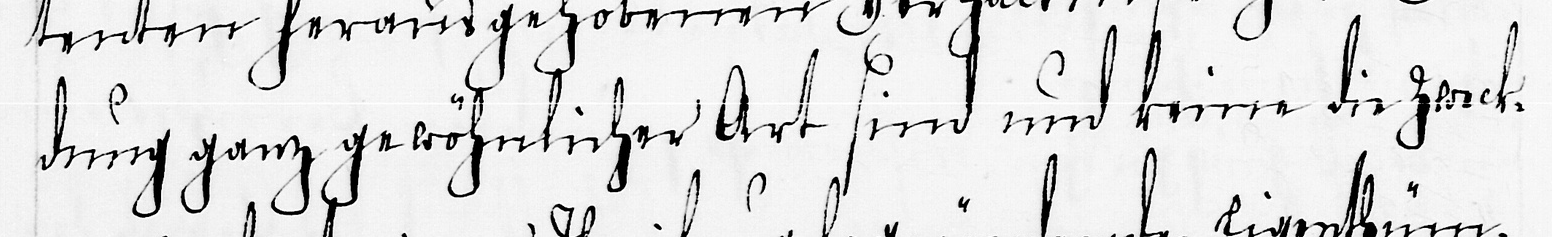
dung ganz gewöhnlicher Art sind und keine die Zweck¬
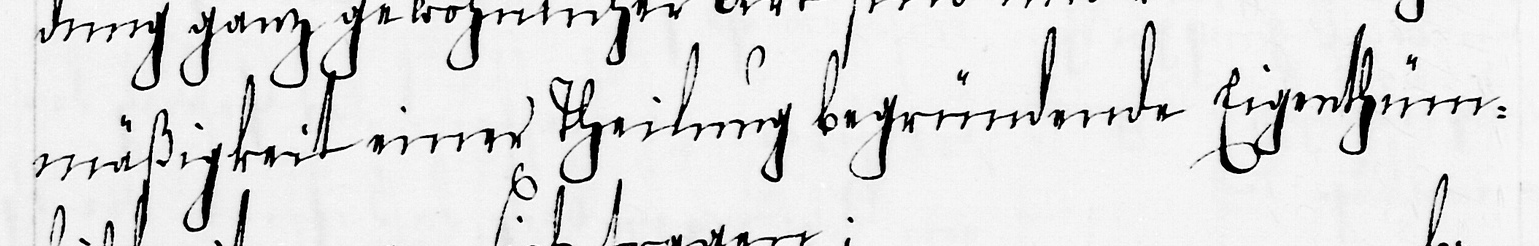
mäßigkeit einer Theilung begründende Eigenthüm¬
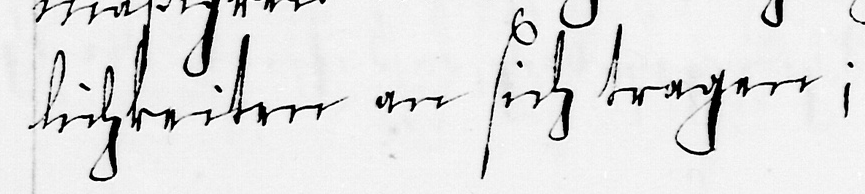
lichkeiten an sich tragen;
